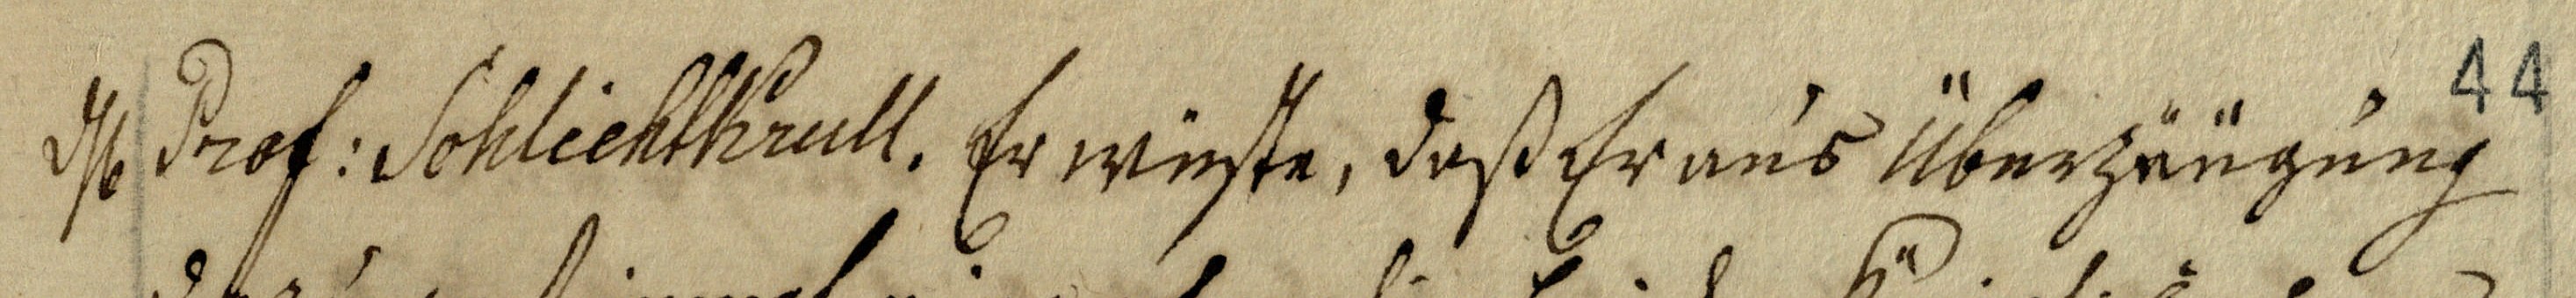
dh Prof. Schlichtkrull. Er wüste, daß Er aus Überzeugung
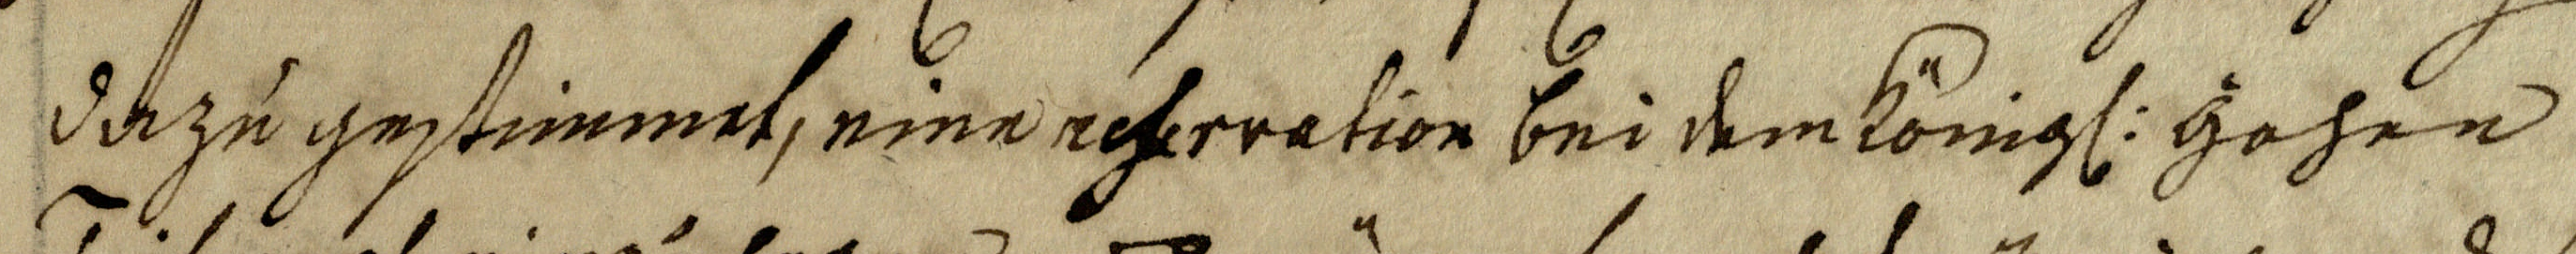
dazu gestimmet, eine reservation bei dem Königl. Hohen
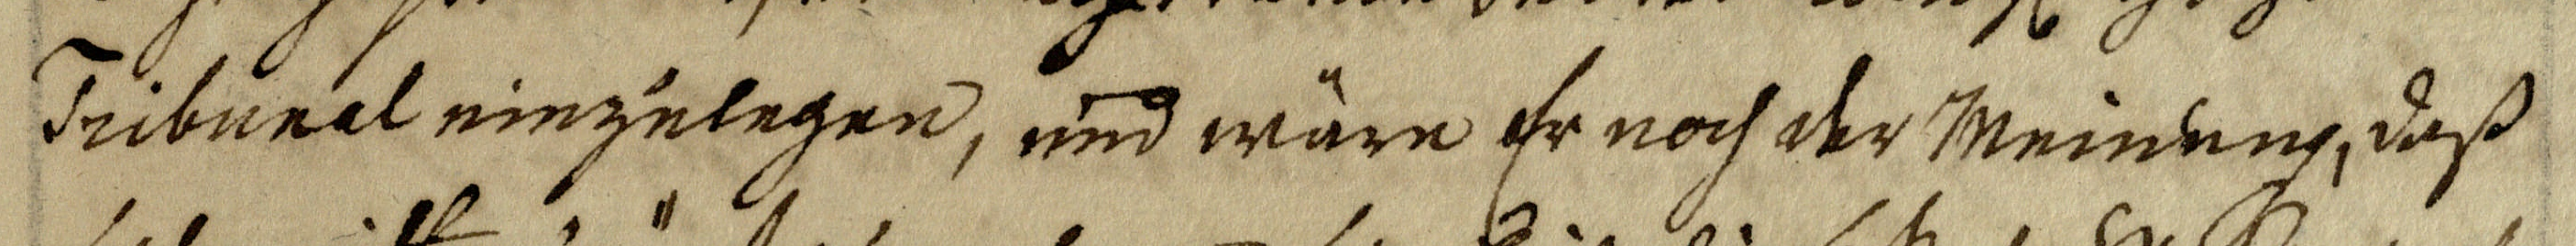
Tribunal einzulegen, und wäre Er noch der Meinung, daß
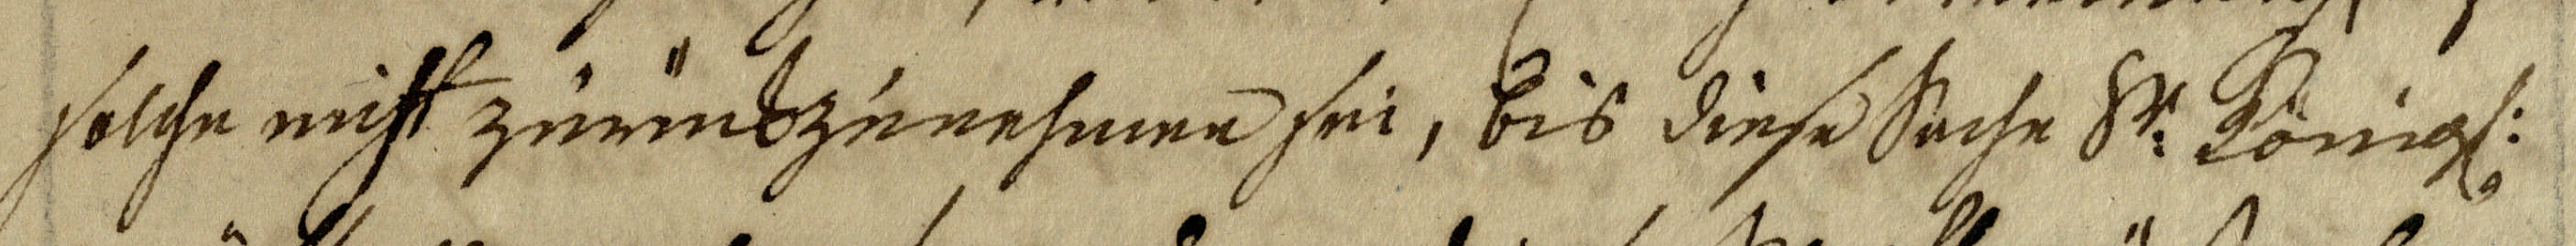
solche nicht zurückzunehmen sei, bis diese Sache Sr Königl.
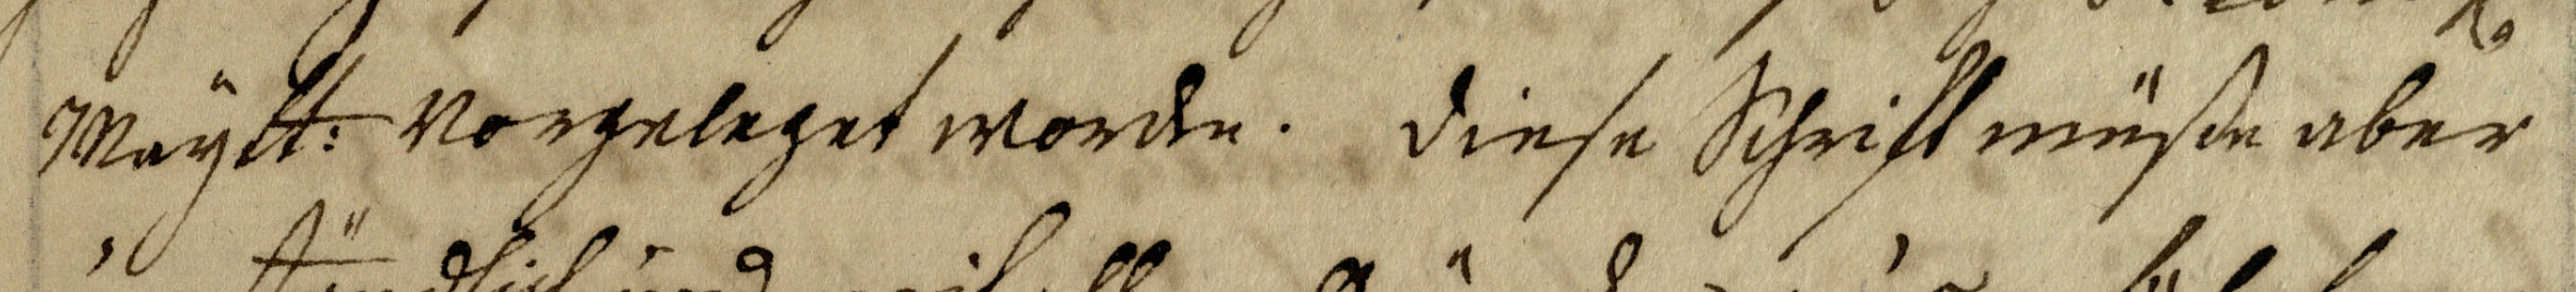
Maÿtt. vorgeleget worden. Diese Schrift müße aber
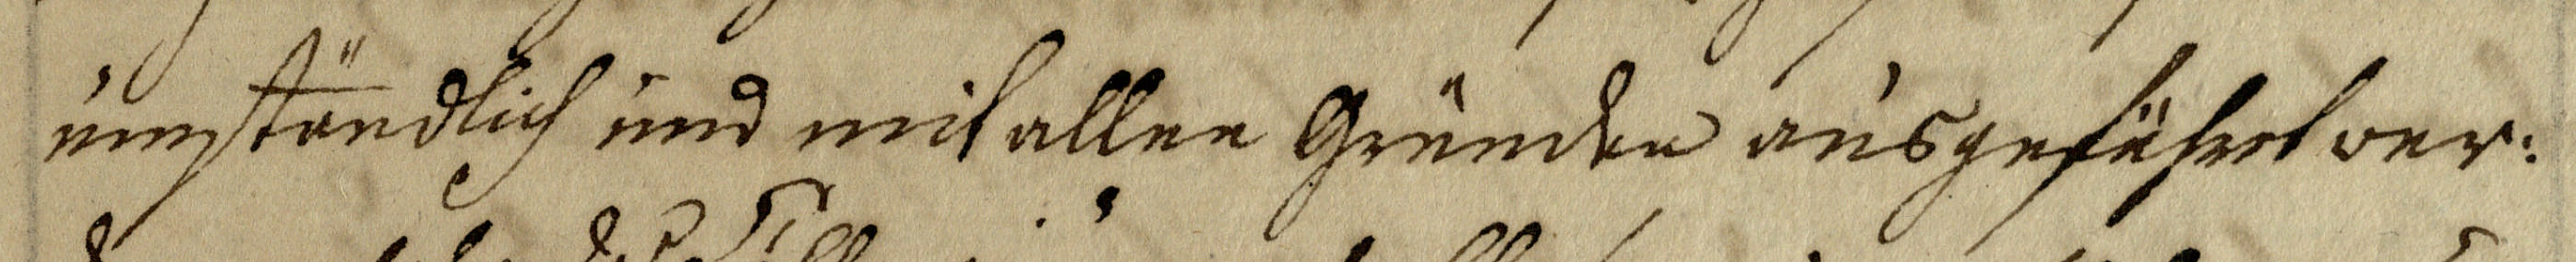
umständlich und mit allen Gründen ausgeführet wer¬
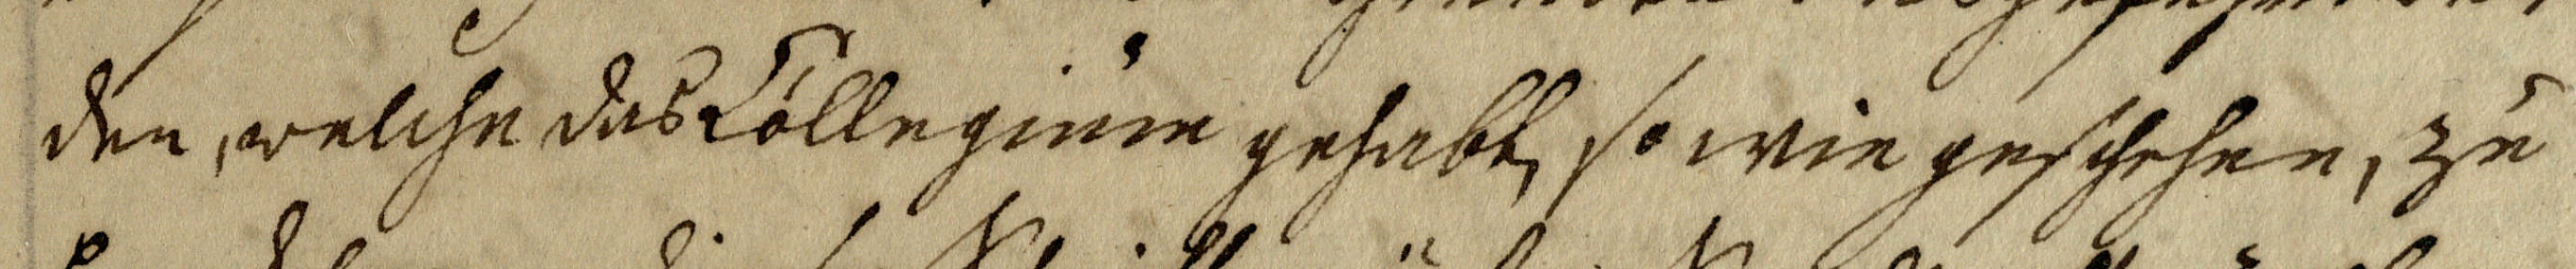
den, welche das Collegium gehabt, so wie geschehen, zu
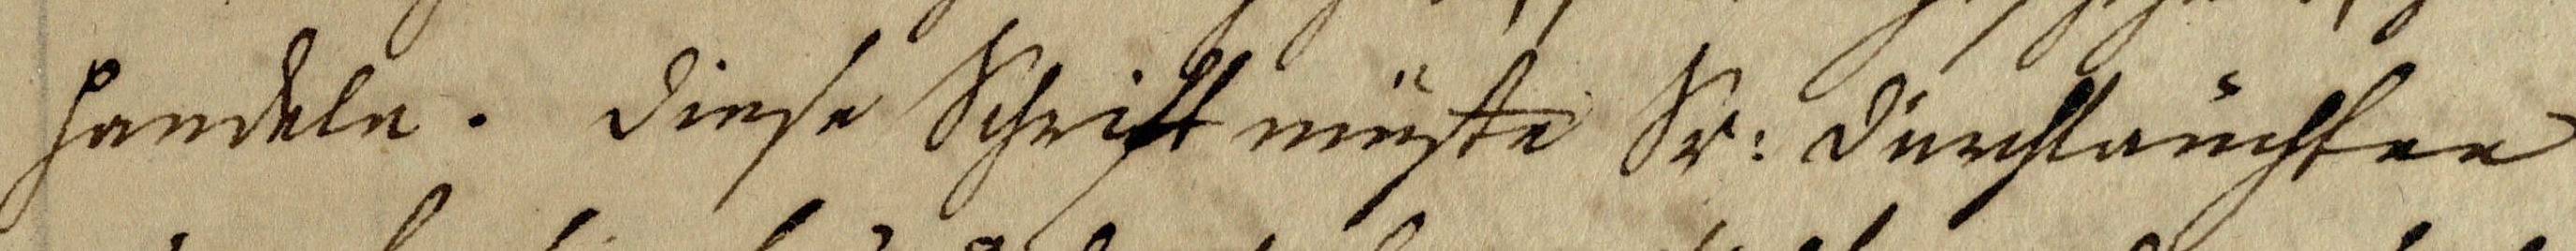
handeln. Diese Schrift müßte Sr Durchlauchten
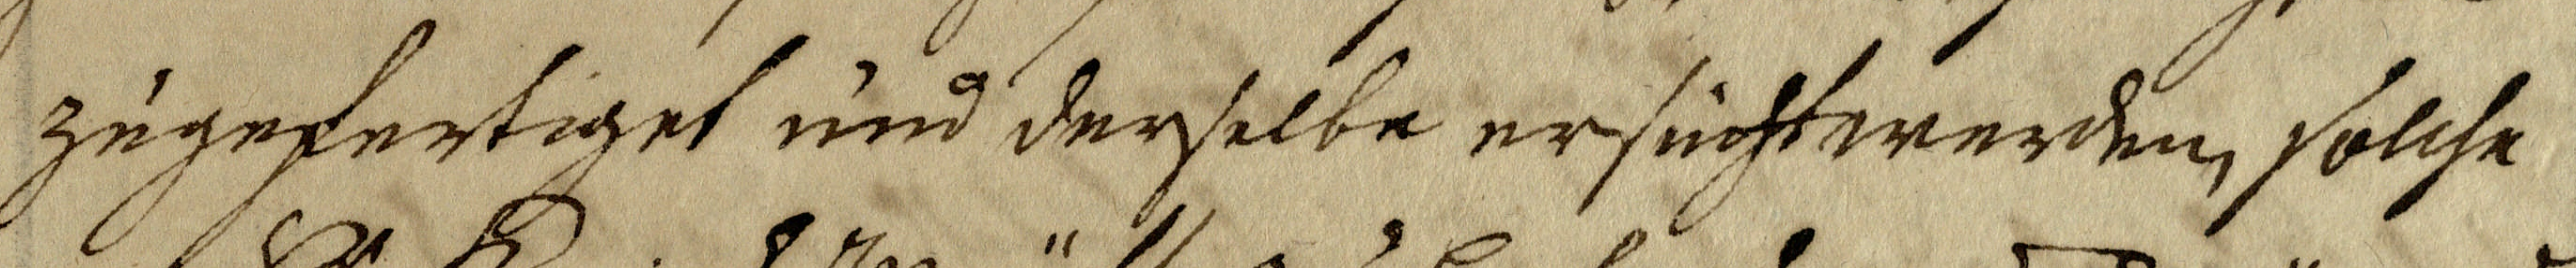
zugefertiget und derselbe ersucht werden, solche
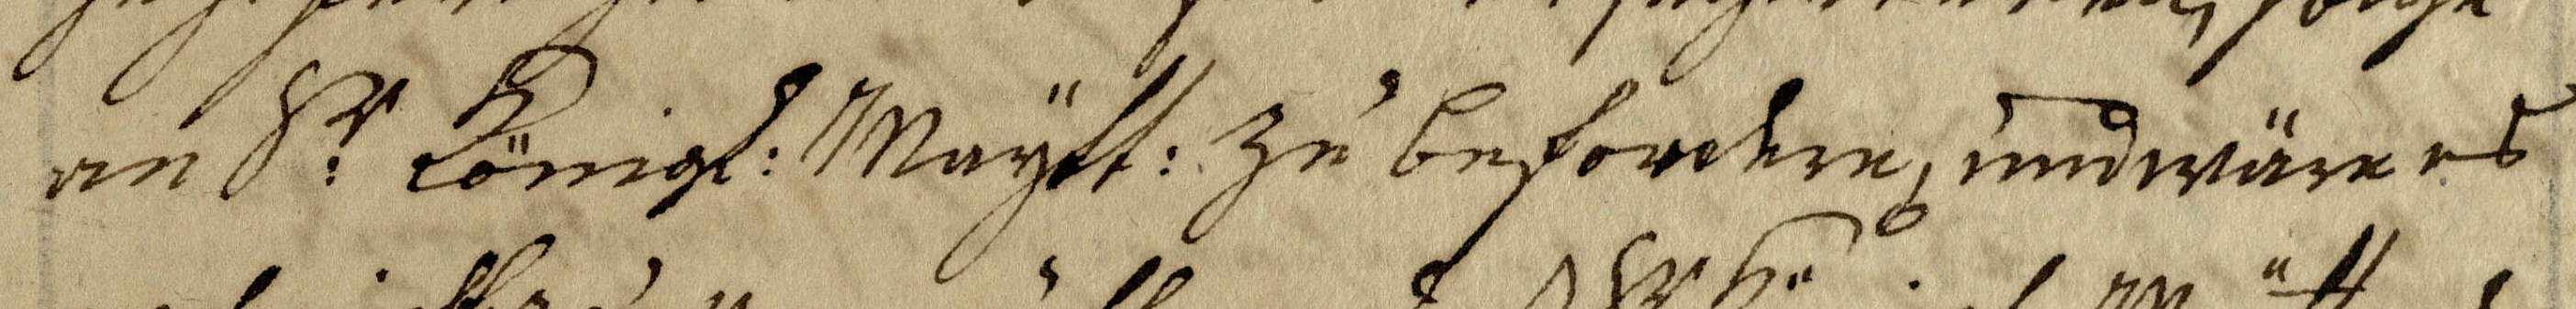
an Sr Königl. Maÿtt. zu befordern, und wäre es
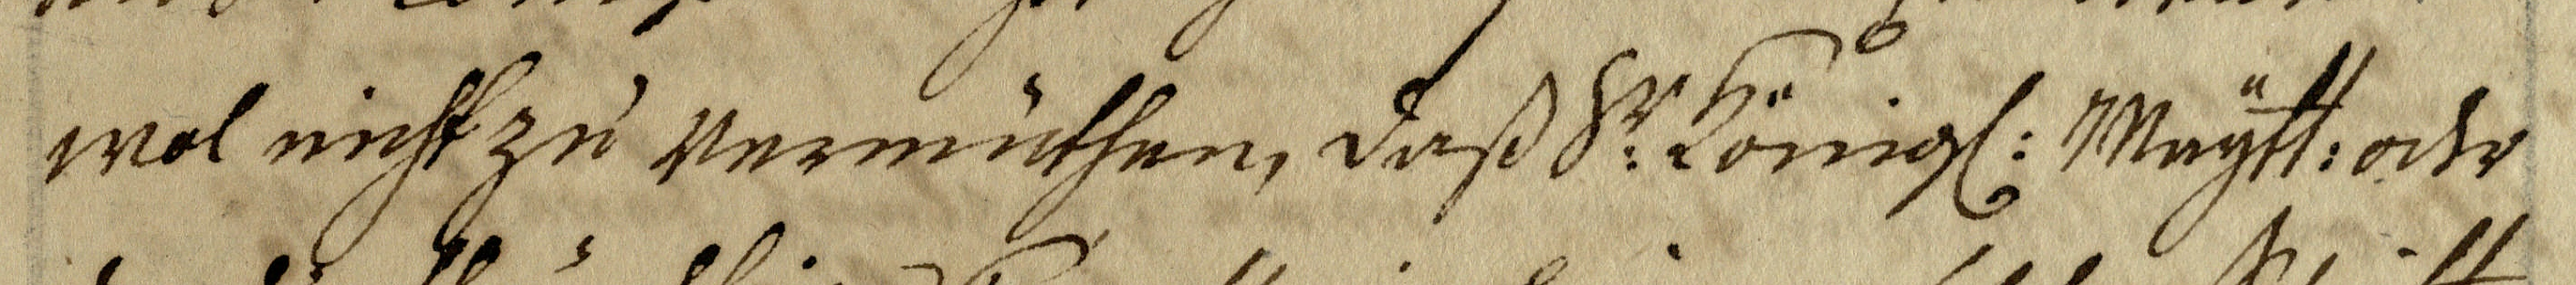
wohl nicht zu vermuthen, daß Sr Königl. Maÿtt. oder
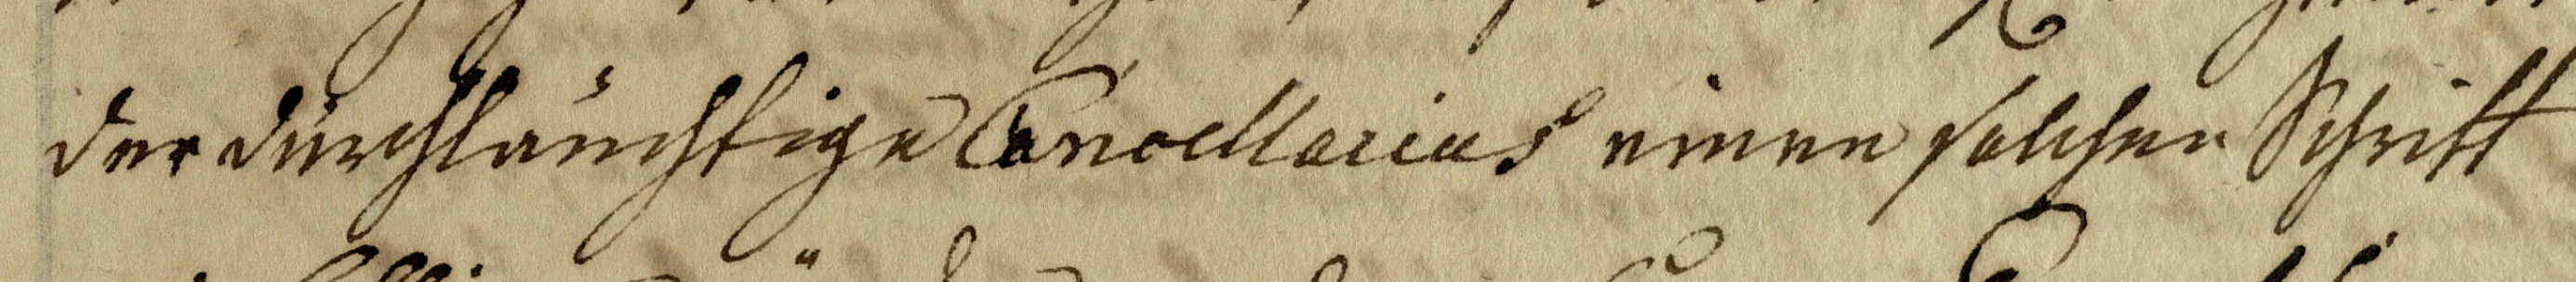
der durchlauchtige Cancellarius einen solchen Schritt
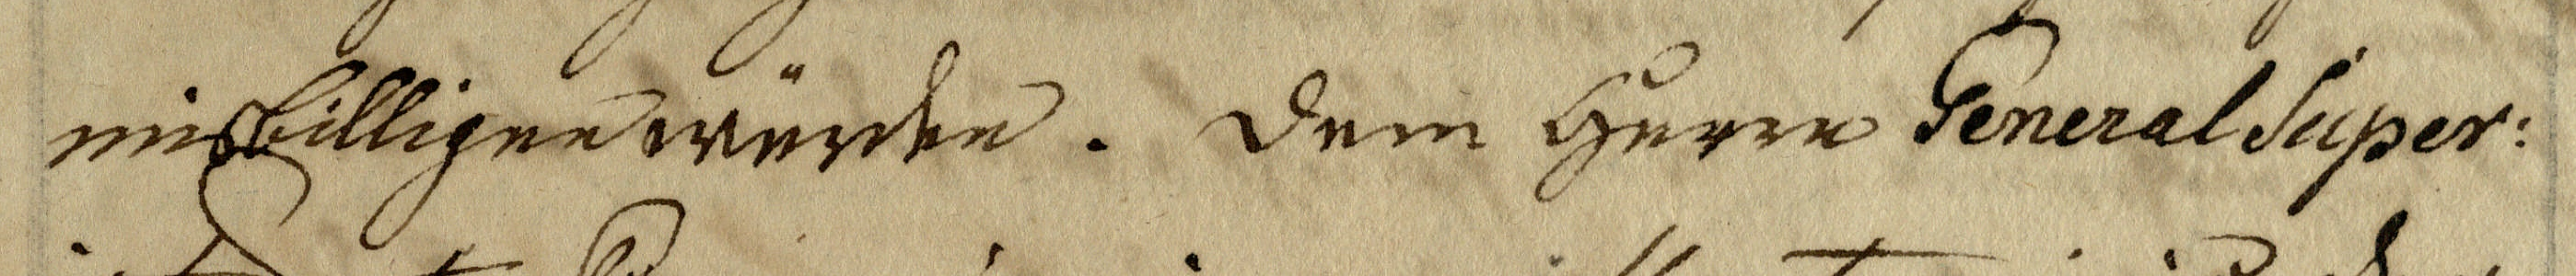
misbilligen würden. Dem Herrn GeneralSuper¬
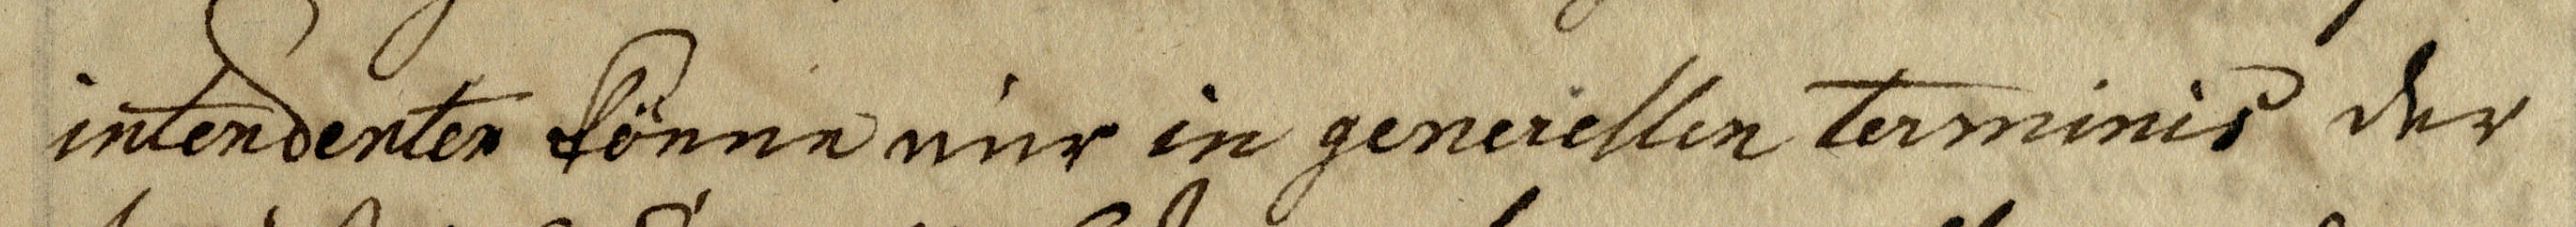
intendenten könne nur in generellen Terminis der
